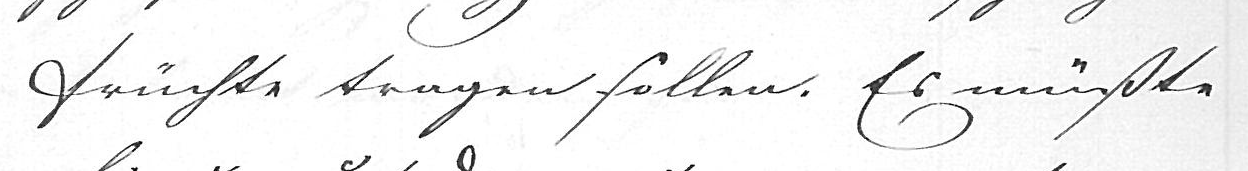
Früchte tragen sollen. Es müßte
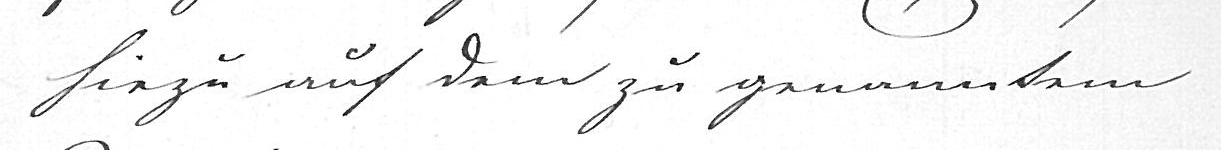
hiezu auf dem zu genannten
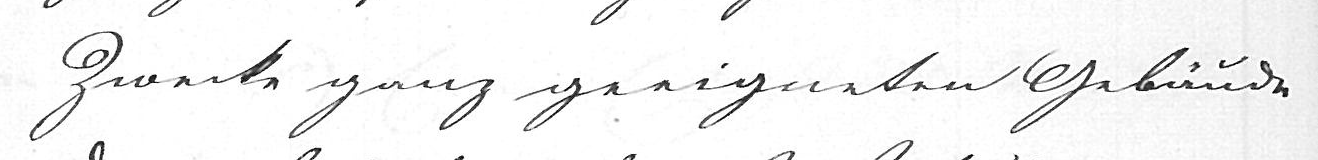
Zwecke ganz geeigneten Gebäude
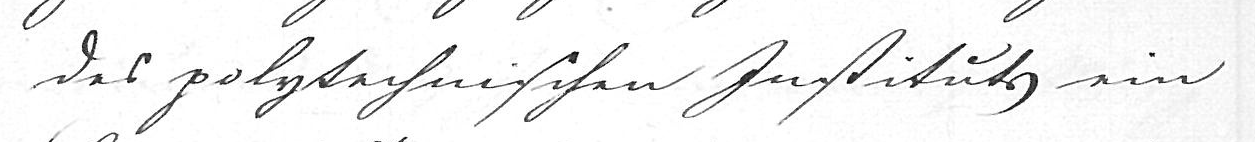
des polytechnischen Instituts ein
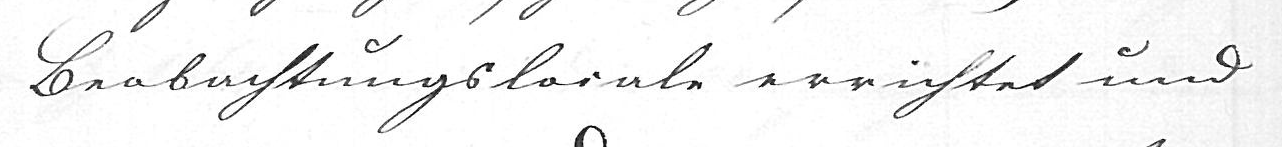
Beobachtungslocale errichtet und
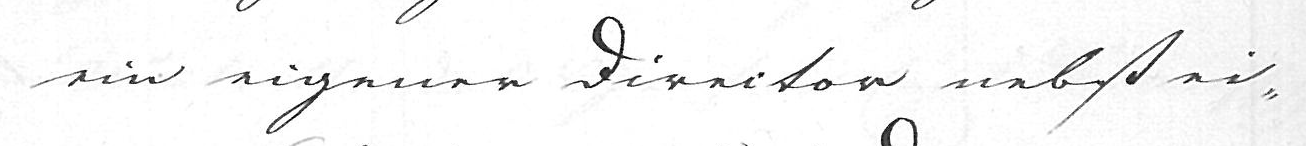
ein eigener Director nebst ei-
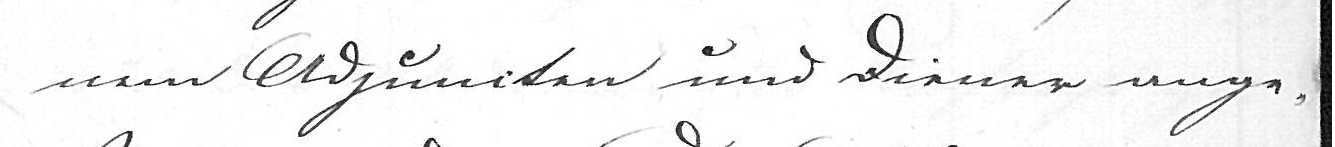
nem Adjuncten und Diener ange-
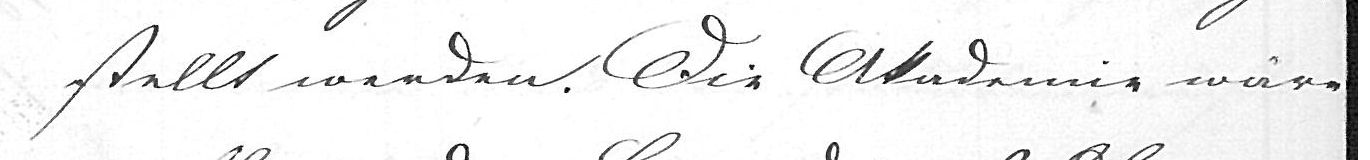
stellt werden. Die Akademie wäre
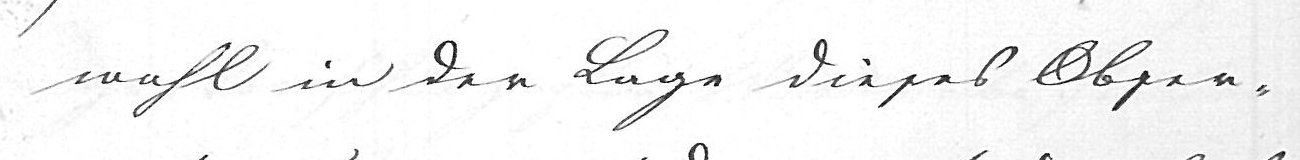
wohl in der Lage dieses Obser-
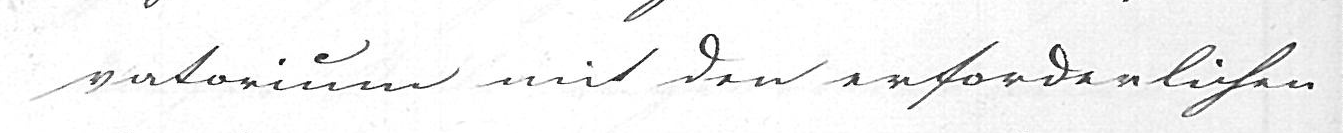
vatorium mit den erforderlichen
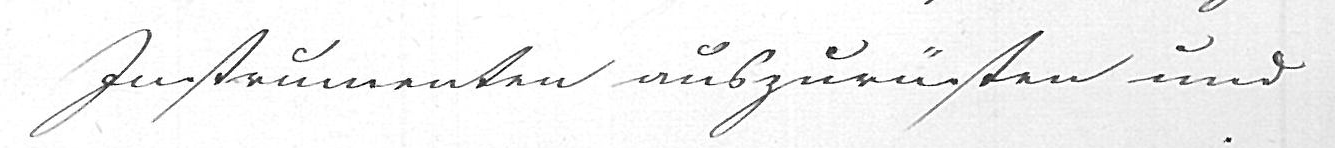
Instrumenten auszurüsten und
